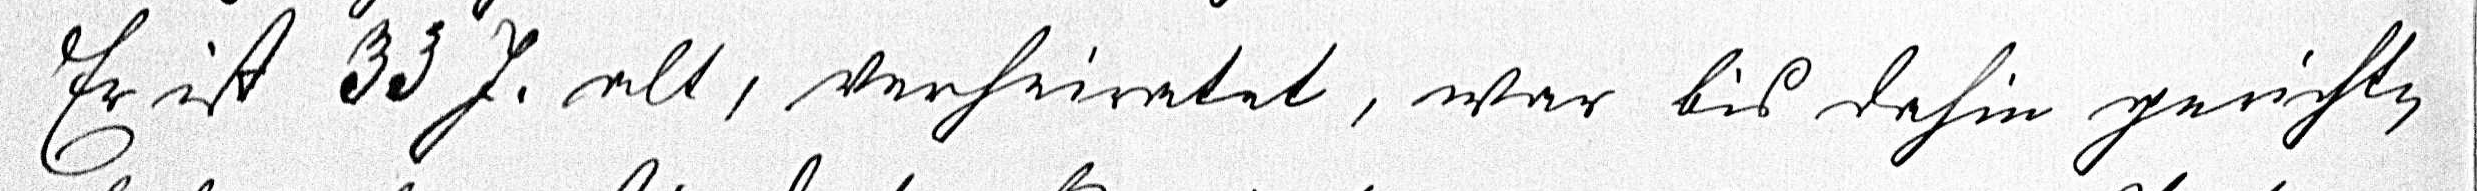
Er ist 33 J. alt, verheiratet, war bis dahin gericht¬
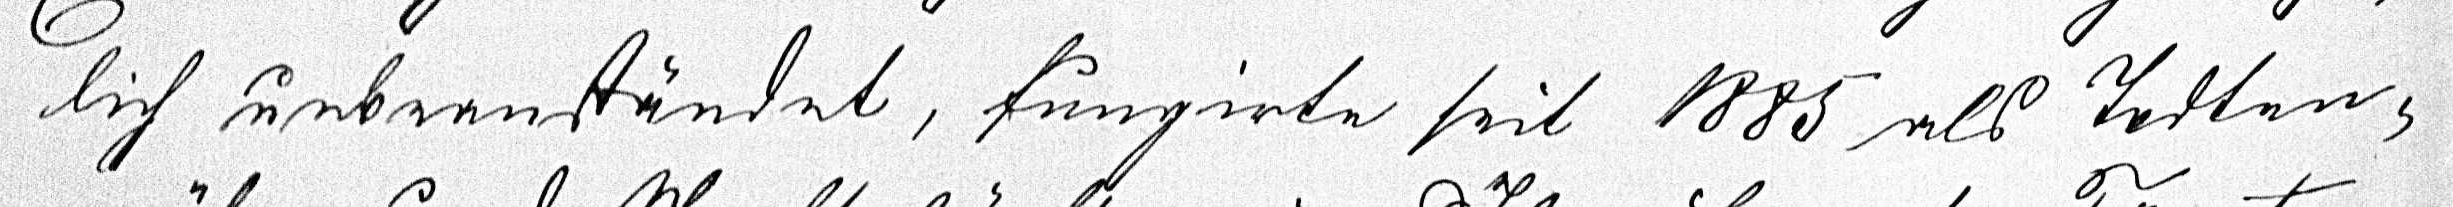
lich unbeanständet, fungirte seit 1885 als Todten¬
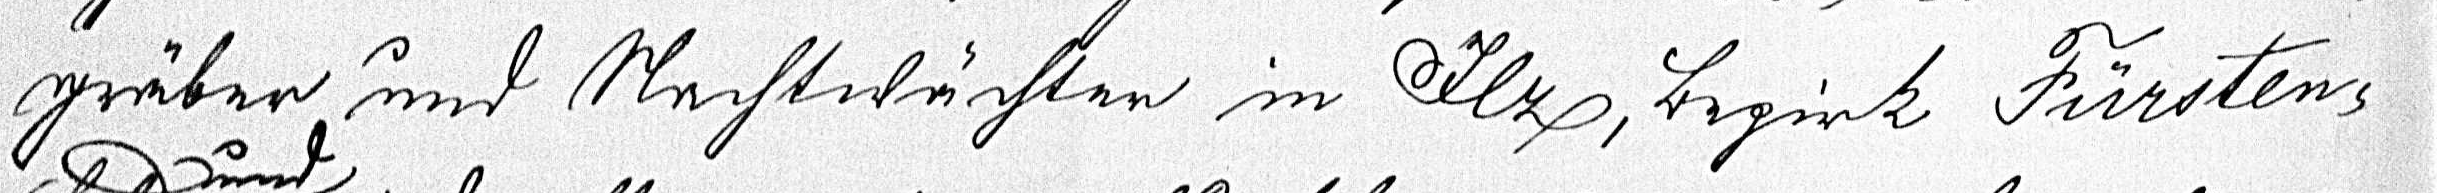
gräber und Nachtwächter in Ilz, Bezirk Fürsten¬
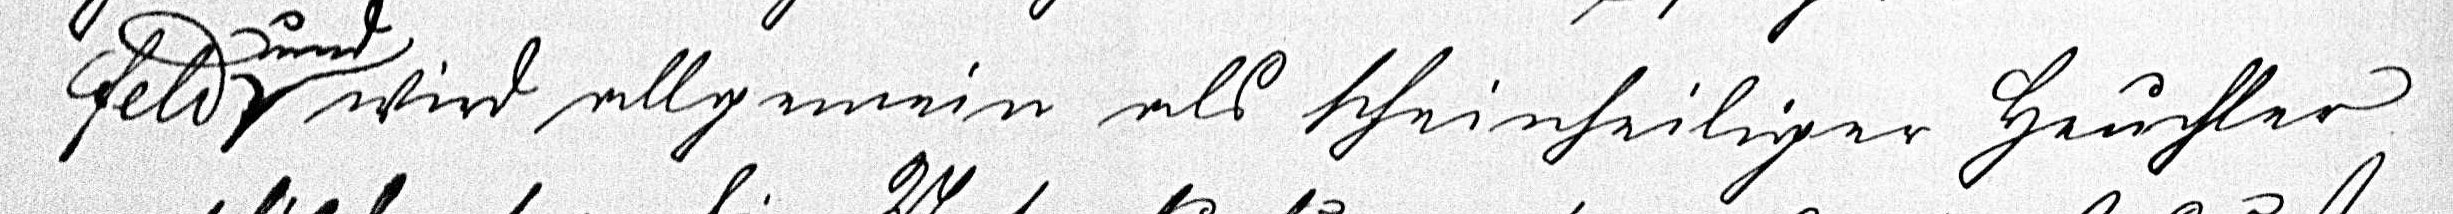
feld und wird allgemein als scheinheiliger Heuchler
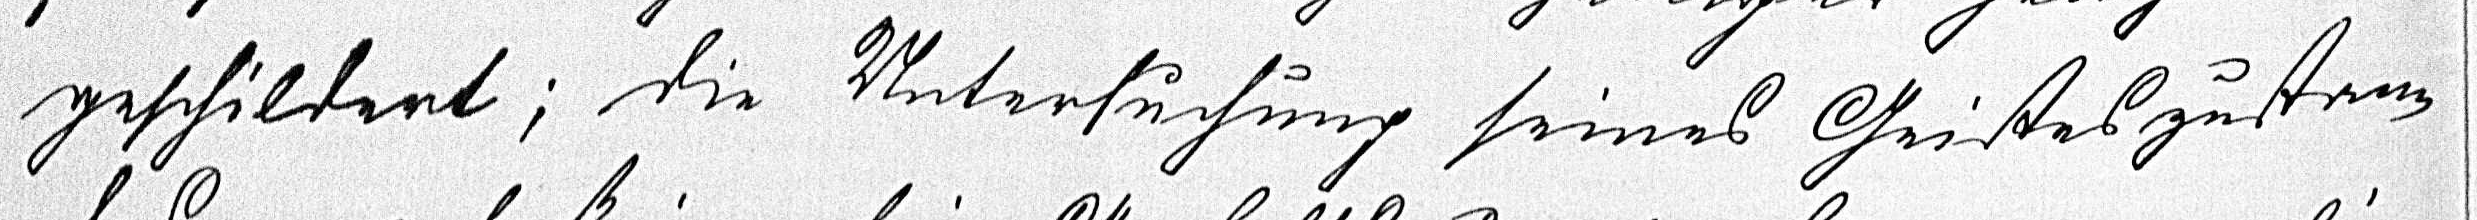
geschildert; die Untersuchung seines Geisteszustan¬
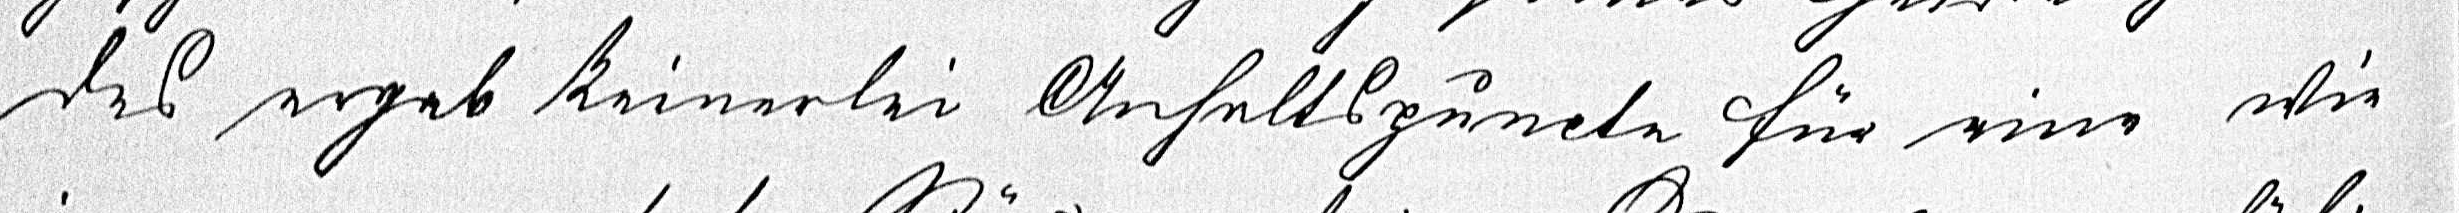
des ergab keinerlei Anhaltspuncte für eine wie
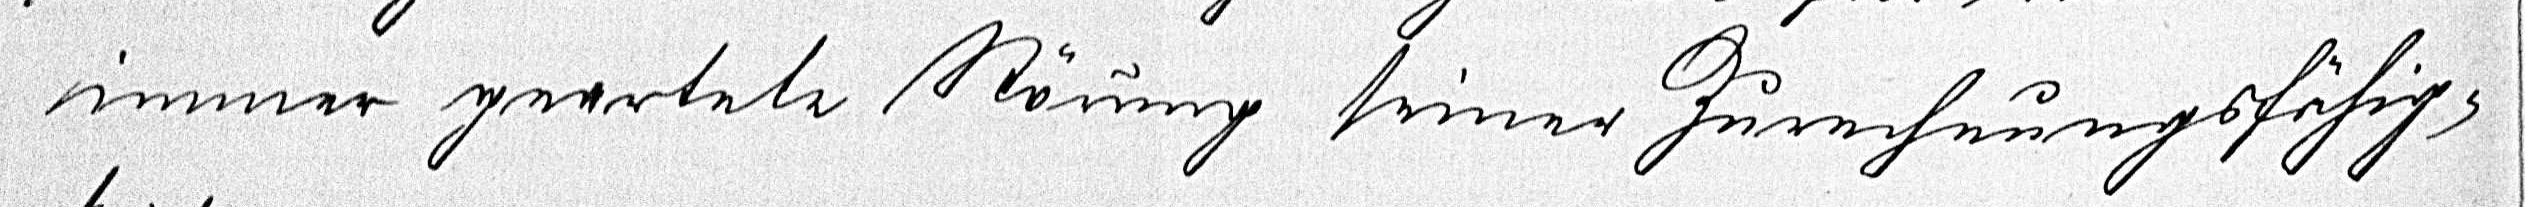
immer geartete Störung seiner Zurechnungsfähig¬
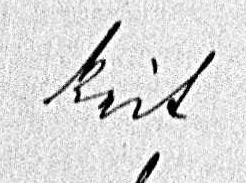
keit.
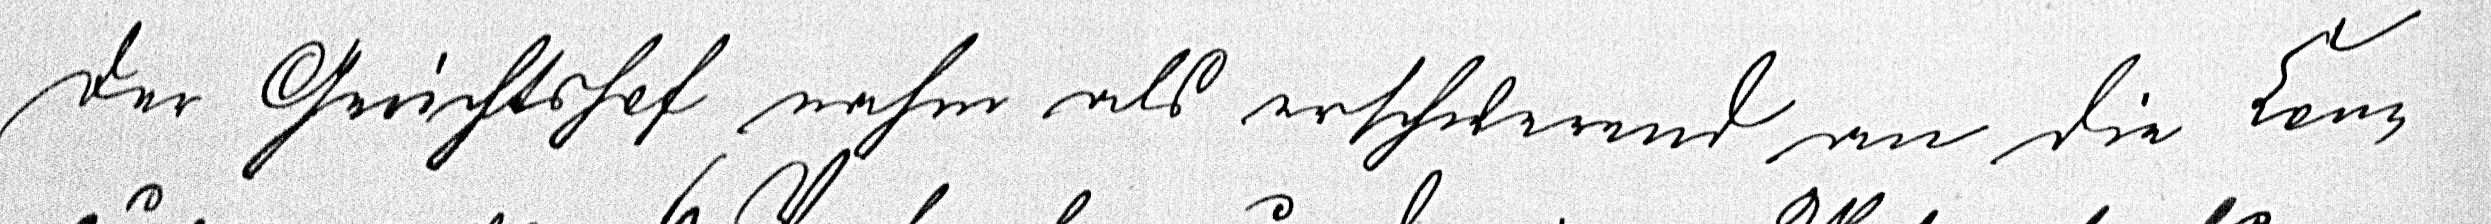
Der Gerichtshof nahm als erschwerend an die Con¬
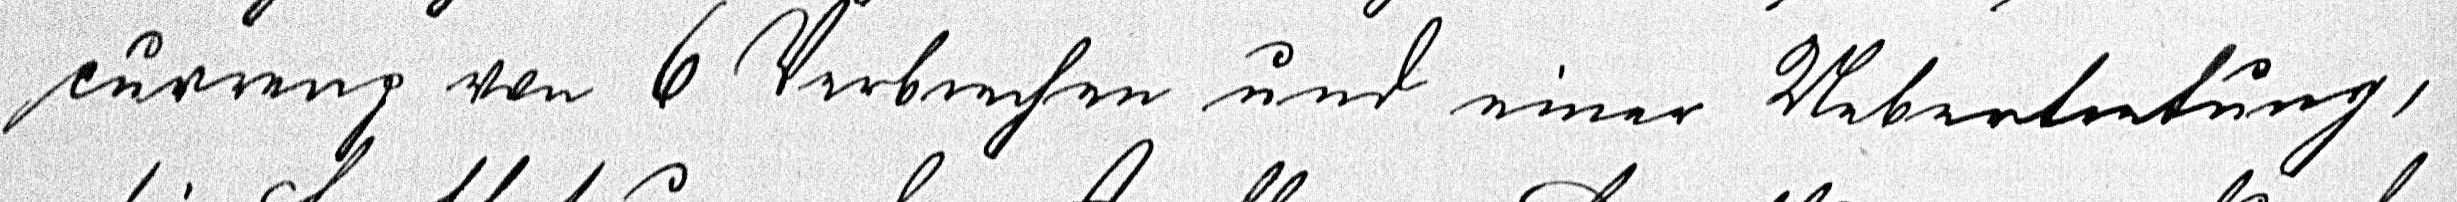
currenz von 6 Verbrechen und einer Uebertretung,
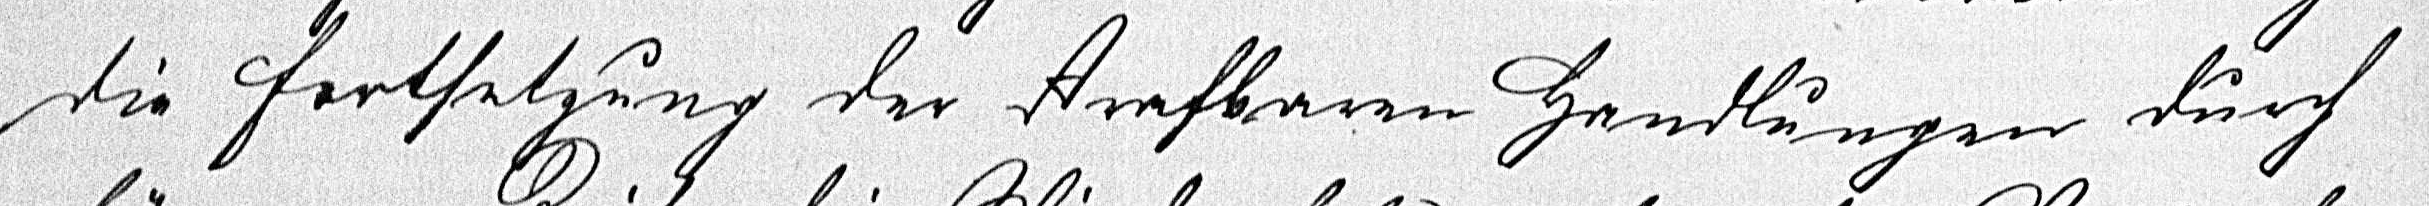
die Fortsetzung der Strafbaren Handlungen durch
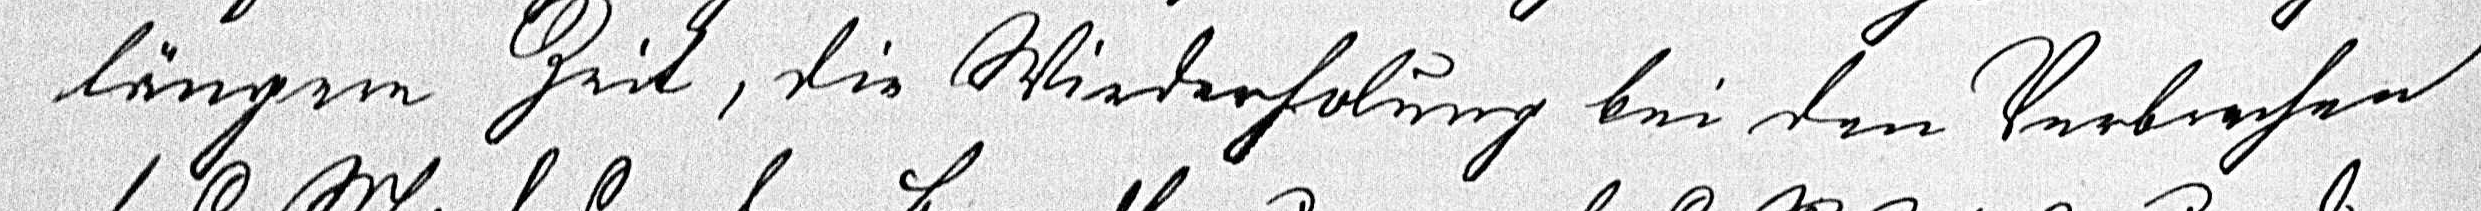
längern Zeit, die Wiederholung bei den Verbrechen
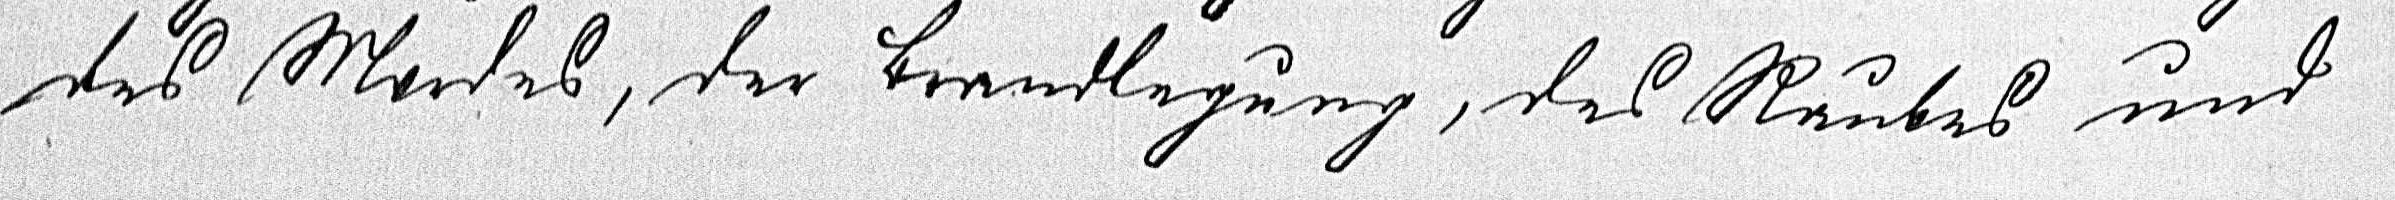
des Mordes, der Barndlegung, des Raubes und
